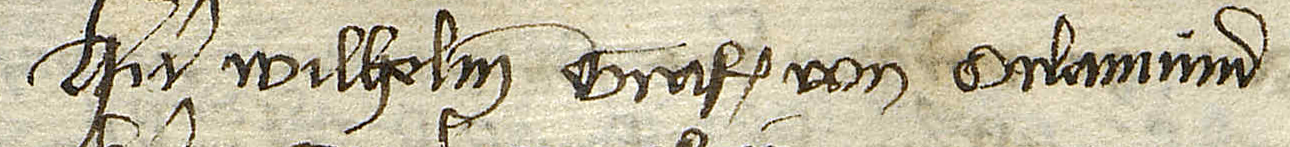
Hn* wilhelm* Graf* von Orlamünd
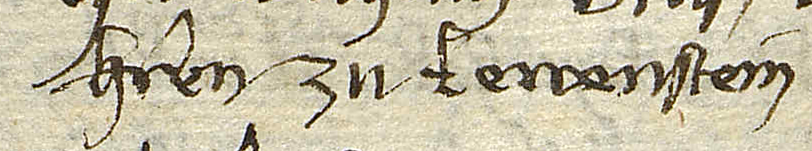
hr*en ʒu Lewenſtein
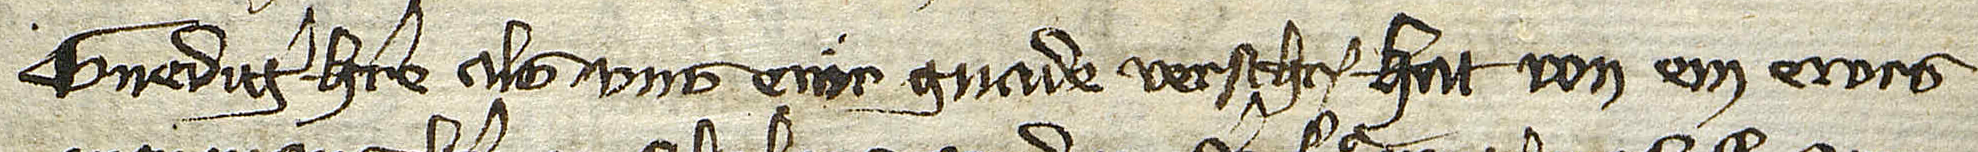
Gnedig* h*re als vns eẅr gnade verſchr* hat von ein ewrs
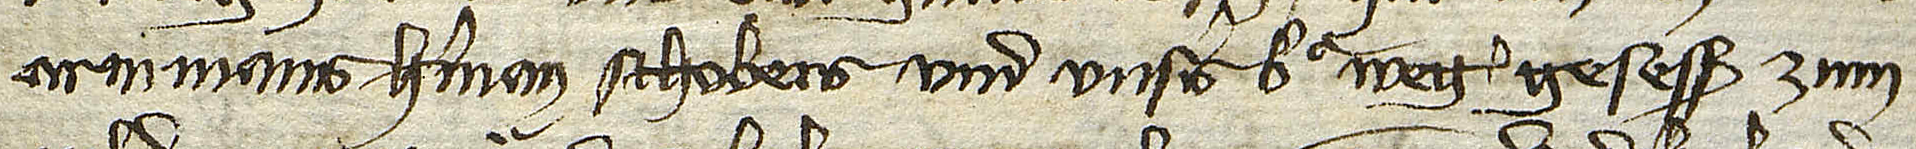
armmans h*man ſchobers vnd vnſ*s b* weg* geſeſſ* ʒum
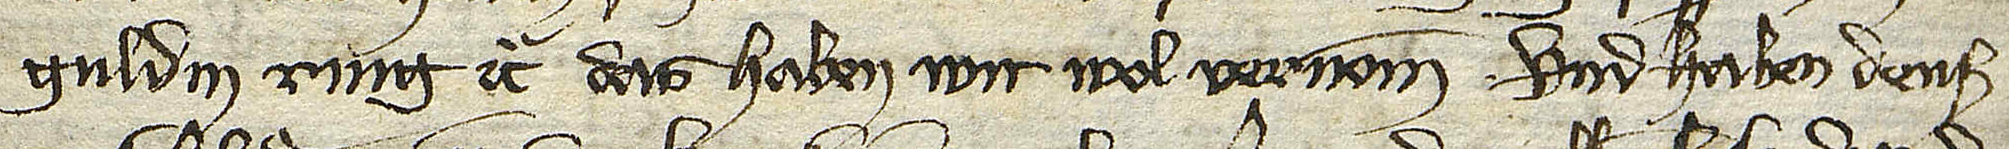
guldin ring ec* das haben wir wol vernom* . Vnd haben denſ*
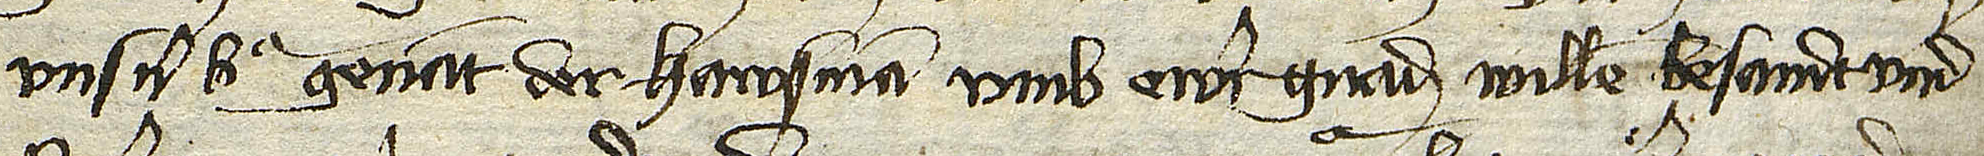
vnſ*n b* genat* der hawſma* vmb ewr* gnad* wille* beſandt vnd
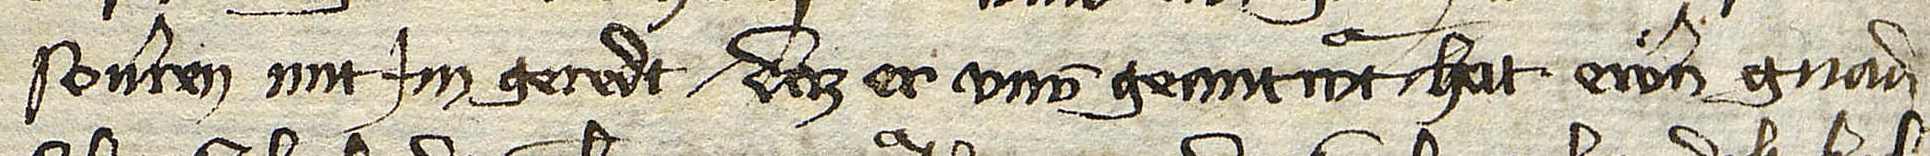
ſou*ren mit Im geredt / Daʒ er vns geantw*t hat eẅn* gnad*
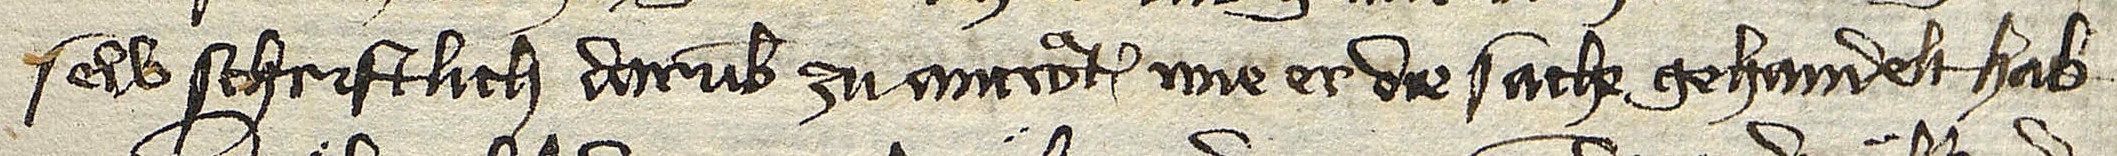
ſelb ſchriftlich darub* ʒu antw*t* wie er die ſache gehandelt hab
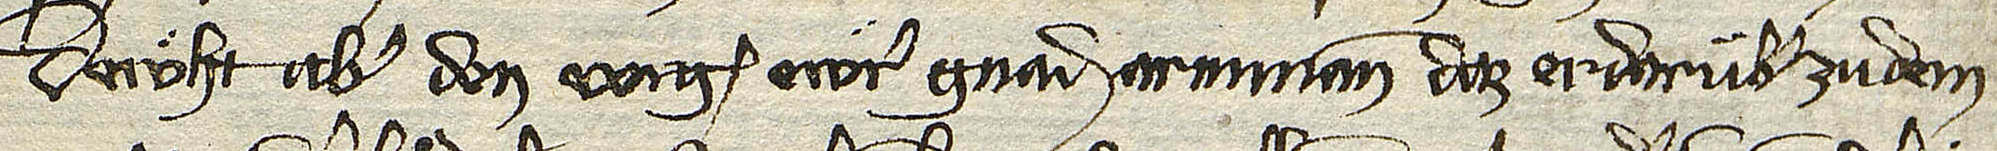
Deẅcht ab* den vorg* eẅr gnad* armman* daʒ er darüb* ʒu dem
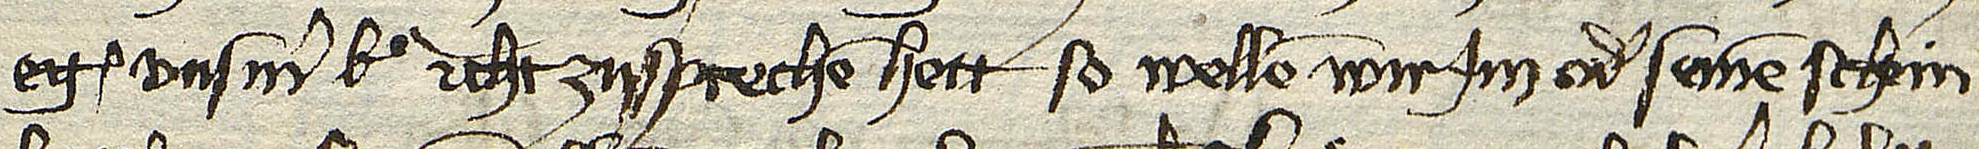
eg* vnſ*m b* icht ʒuſpreche* hett* ſo welle* wir Im od* ſeine* ſchein
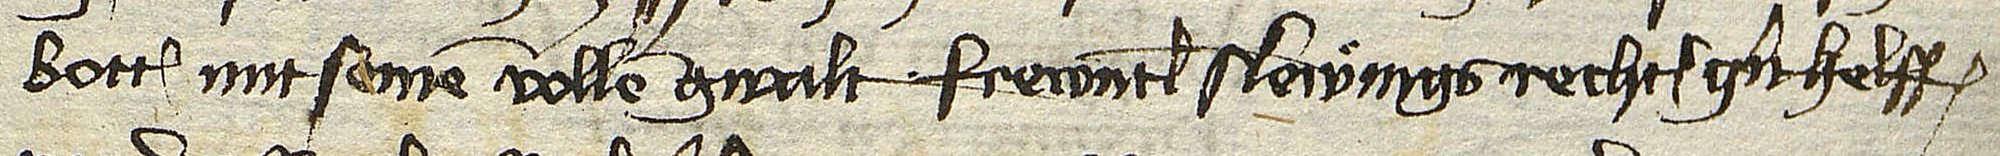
bott* mit ſeine volle* gwalt . frewntl* ſleẅnigs rechtl* g*n helff*
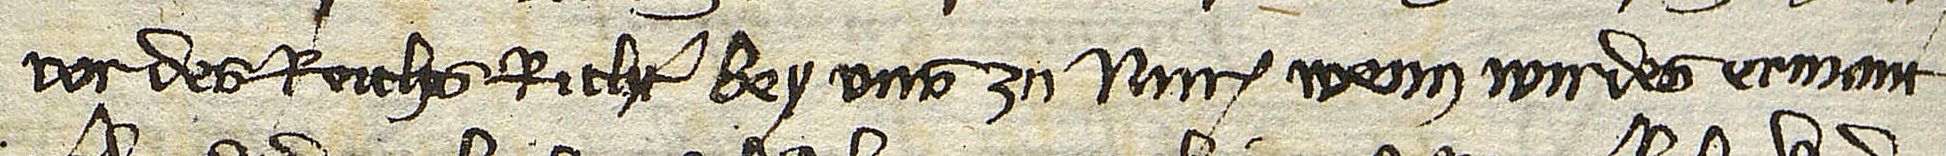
vor des Reichs Richt* bey vns ʒu Nur* wenn wir des ermant
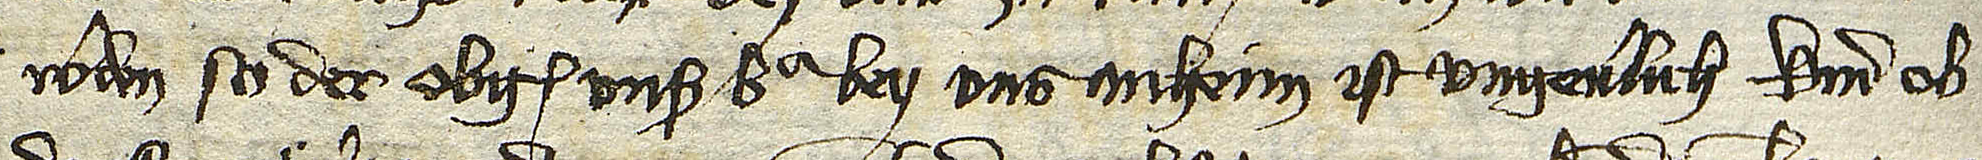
w*den ſo der obg* vnſ* b* bey vns anheim iſt vngeu*lich Vnd ob
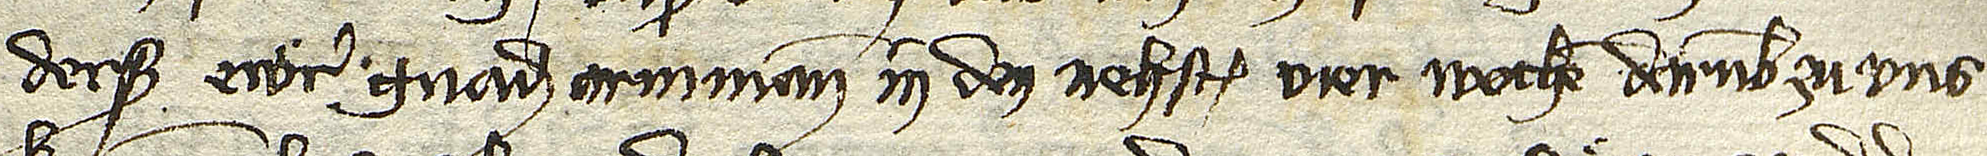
derſ* eẅr gnad* armman* in den nehſt* vier woche* darub* ʒu vns
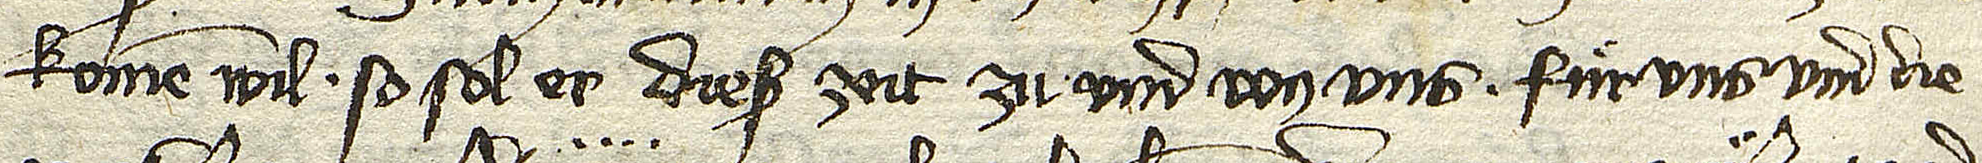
kome* wil . ſo ſol er dieſ* ʒeit ʒu vnd von vns . für vns vnd die
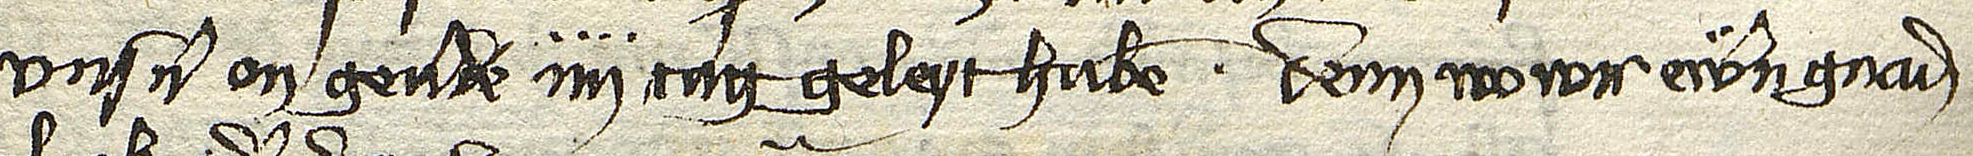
vnſ*n on geu*de iiii tag geleyt habe* . Denn wo wir eẅn* gnad*
